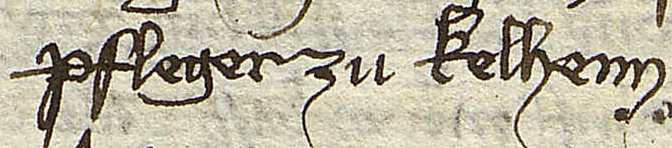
pfleger ʒu Kelheim
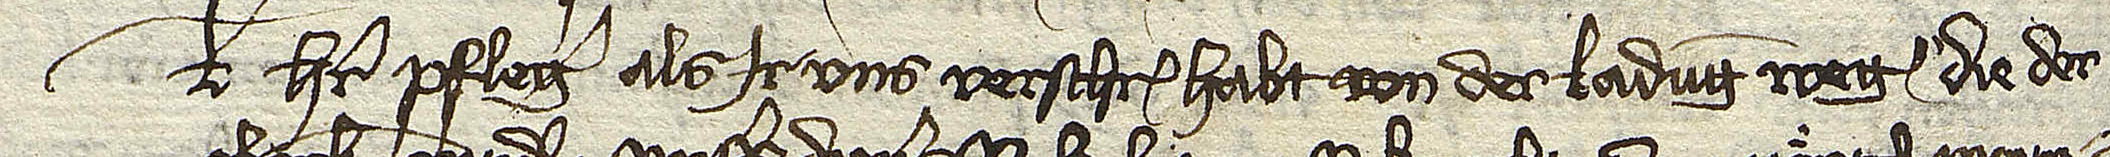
L* hr* pfleg* als Ir vns verſchr* habt von der ladug* weg* die der
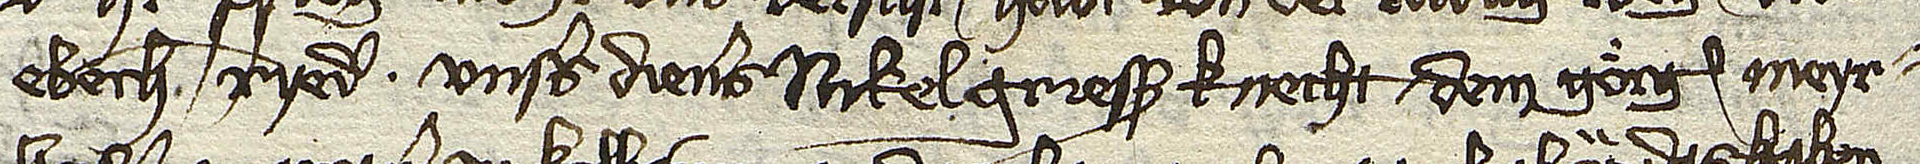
eberh* ryed* . vnſ*s dien*s Nikel grieſſ knecht / dem görg* meyr =
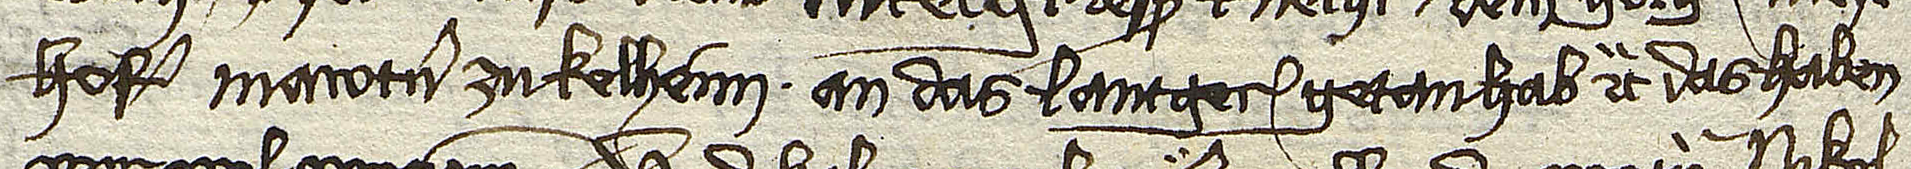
hof* mawtn* ʒu kelheim . an das lantger* getan hab ec* das haben
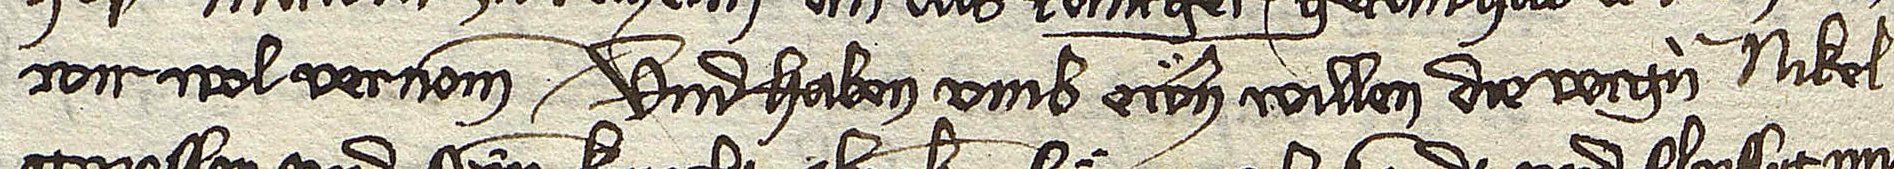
wir wol vernom* / Vnd haben vmb ew*n willen die vorgn* Nikel
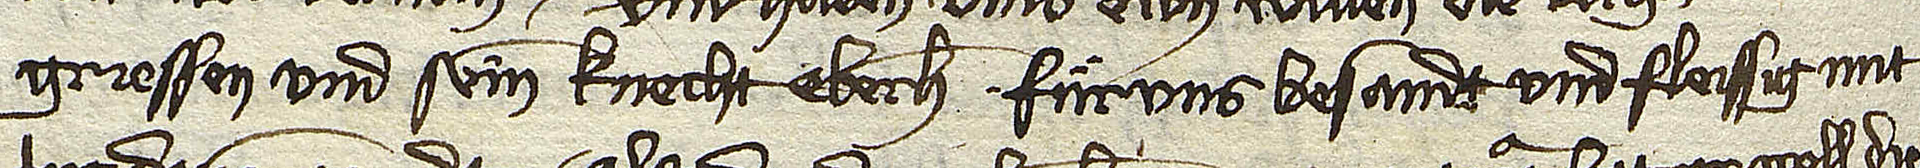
grieſſen vnd ſein* knecht eberh* . für vns beſandt vnd fleiſſig mit
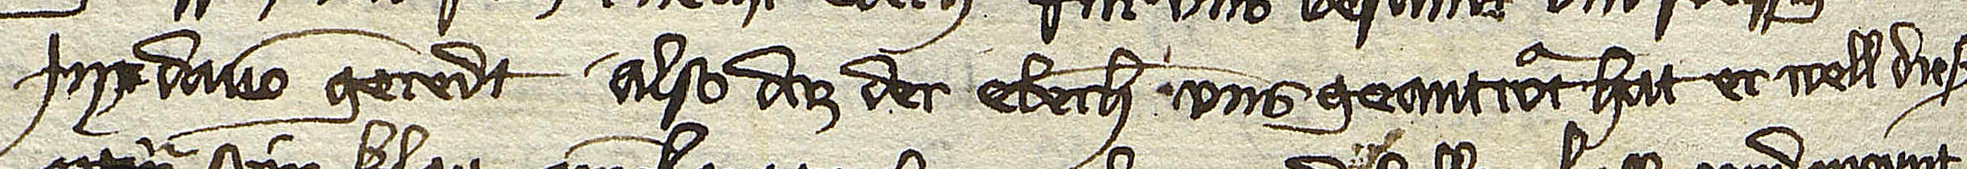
Im dauo* geredt / also daʒ der eberh* vns geantw*t hat er well dieſ*
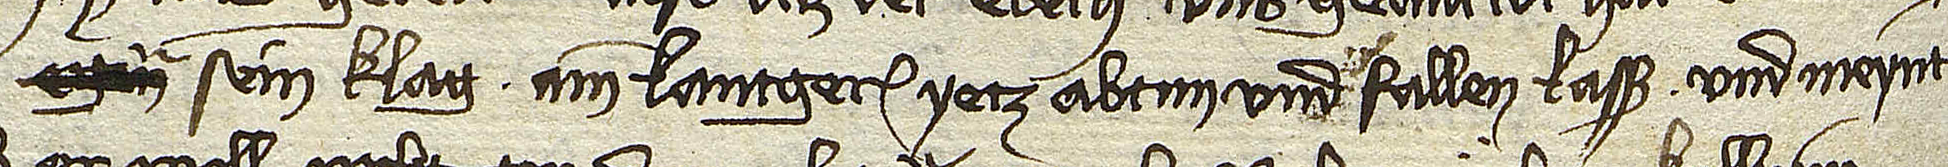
egen* ſein klag . am* lantger* yecʒ abtun vnd fallen laſſ* . vnd meynt
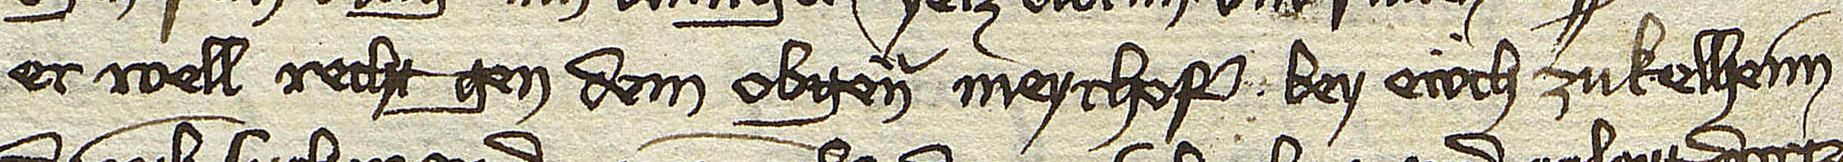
er well recht gen dem obgen* meyrhof* bey ewch ʒu kelheim
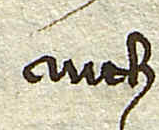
auch
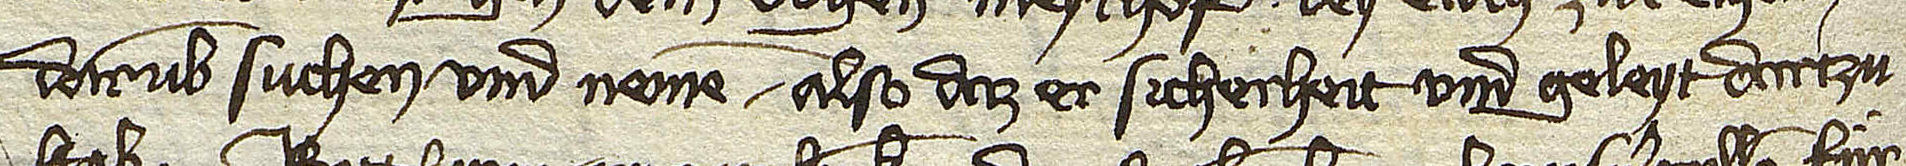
darub* ſuchen vnd neme* / alſo daʒ er ſicherheit vnd gelegt darcʒu
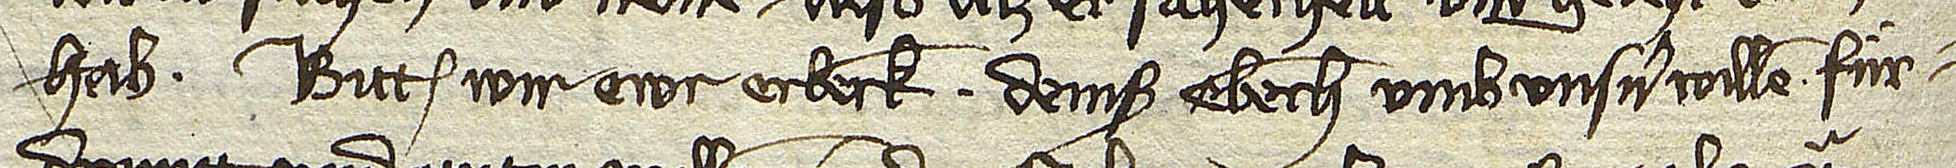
hab . Bitt* wir ewr erberk* . demſ* eberh* vmb vnſn* wille* . für =
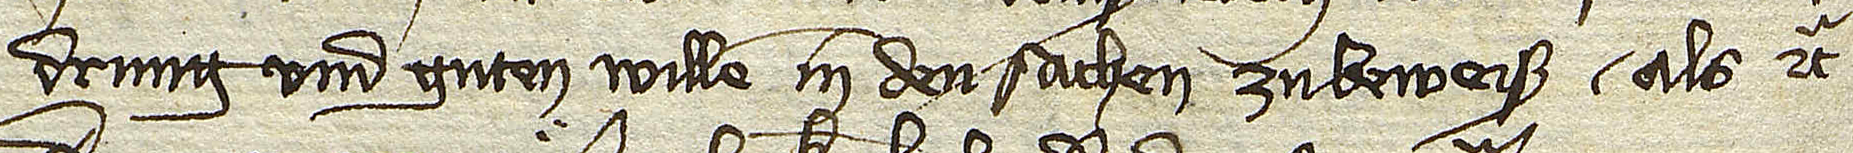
drung vnd guten wille* in den ſachen ʒu beweiſ* / als ec*
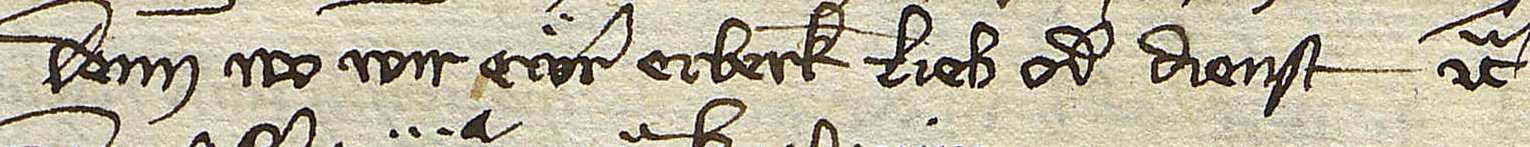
Denn wo wir ewr* erberk* lieb od* dienſt ec*
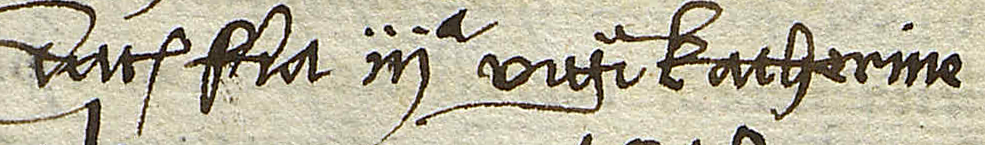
Dat* fi*a iii* vigi* katherine
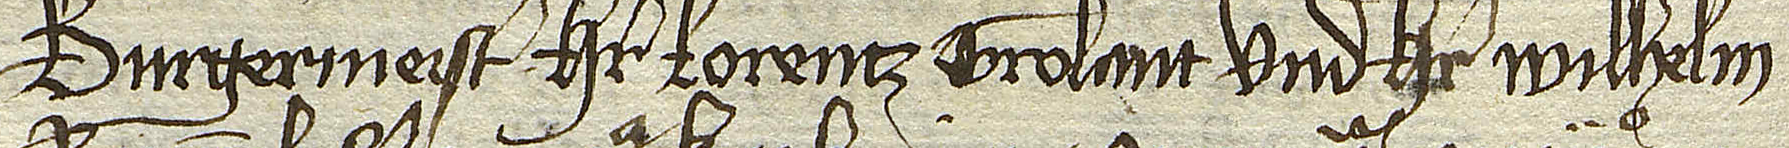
Burgermeiſt* Hr* Lorencʒ Grolant Vnd Hr* wilhelm
